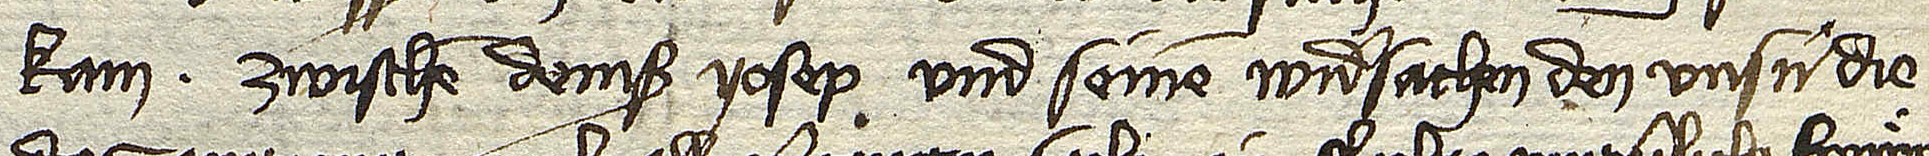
kam . ʒwiſche* demſ* yoſep vnd ſeine* wid*ſachen den vnſn* die
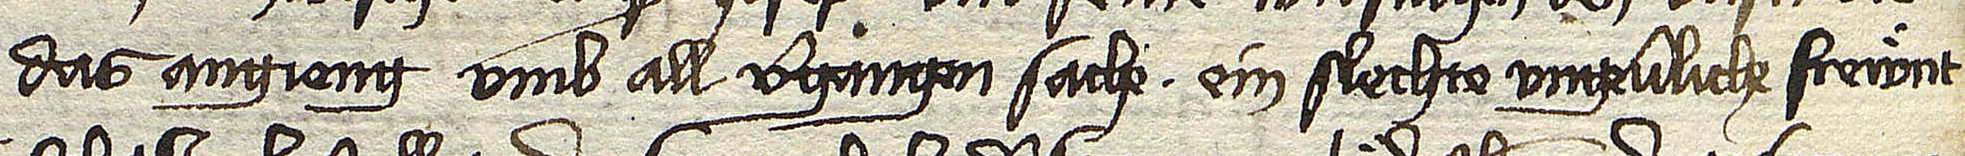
das angieng vmb all vgangen* ſache . ein ſlechte vngeu*liche frewnt
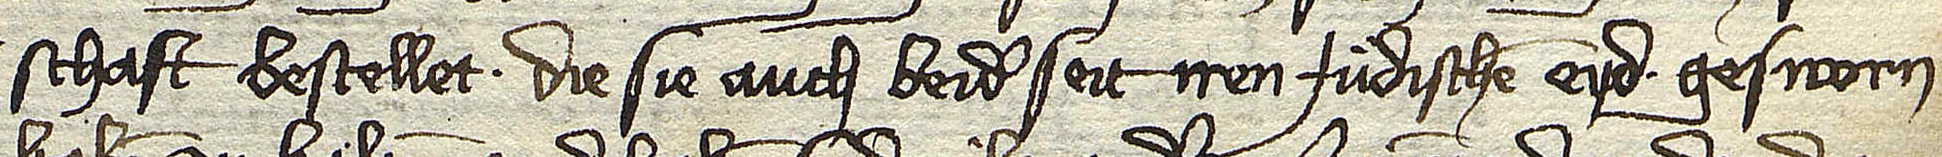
- ſchaft beſtellet . die ſie auch beid* ſeit iren Iüdiſche* eyd . geſworn
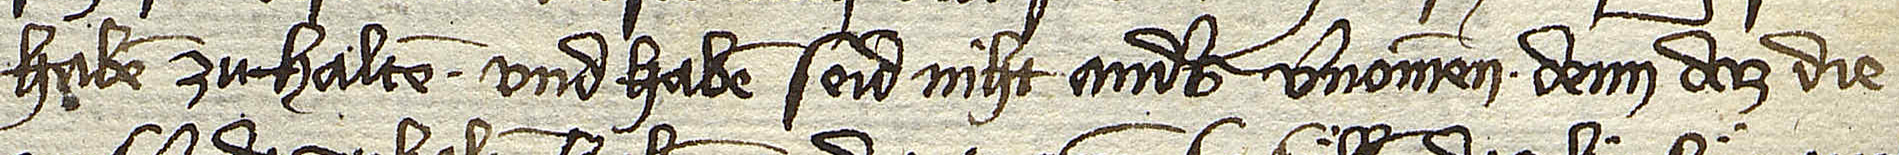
habe* ʒu halte* . vnd habe* ſeid niht and*s vnomen* . denn daʒ die
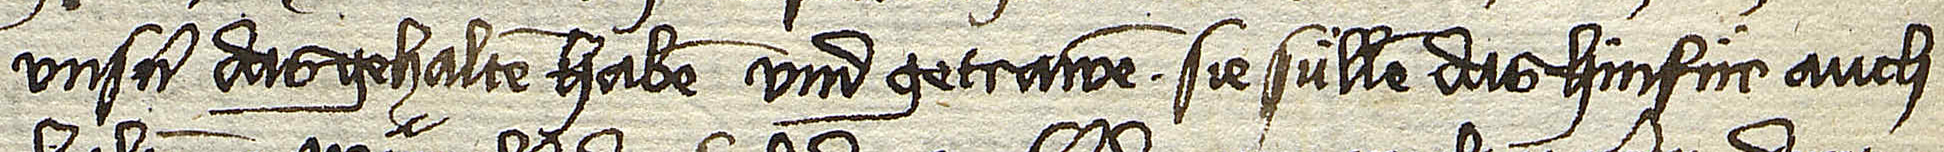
vnſn* das gehalte* habe* vnd getrawe* . ſie ſülle* das hinfür auch
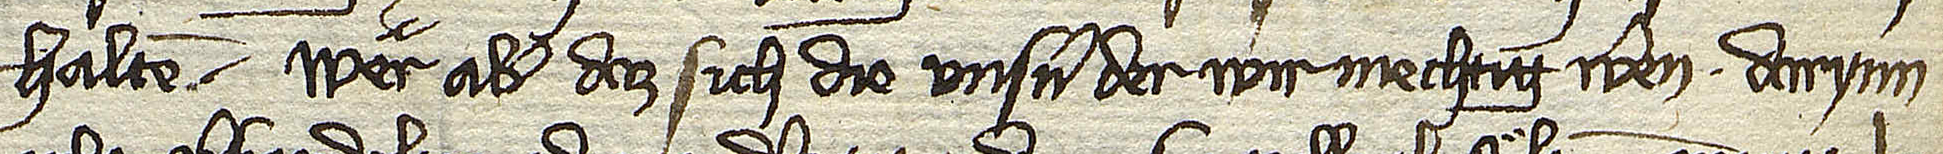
halte* / Wër ab* daʒ ſich die vnſn* der wir mechtig wen* . darynn
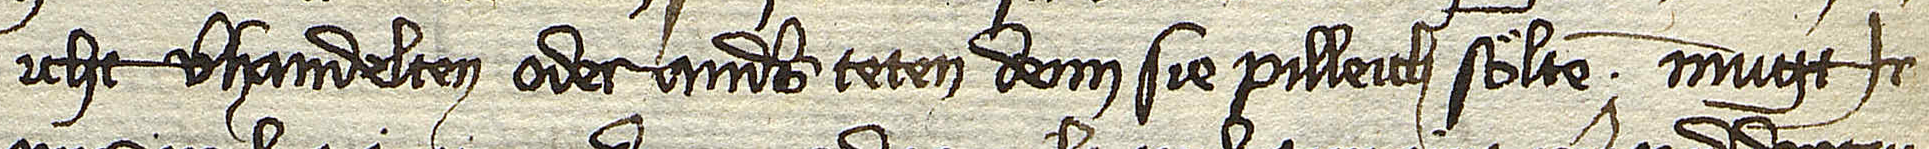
icht v*handelten oder and*s teten denn ſie pilleich ſölte* . mugt Ir
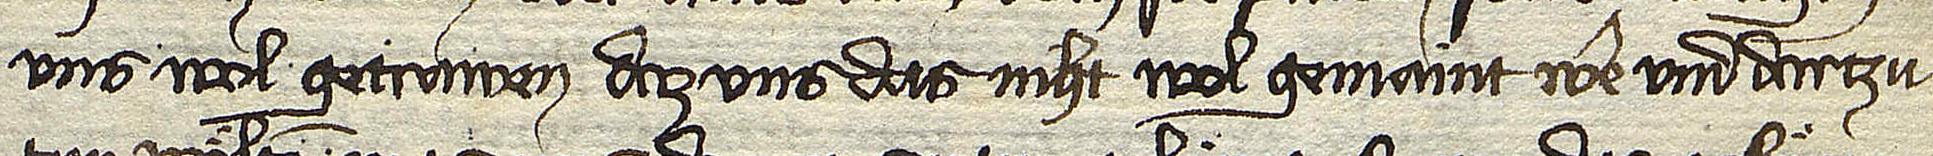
vns wol getrawen daʒ vns das niht wol gemaint we* vnd darcʒu
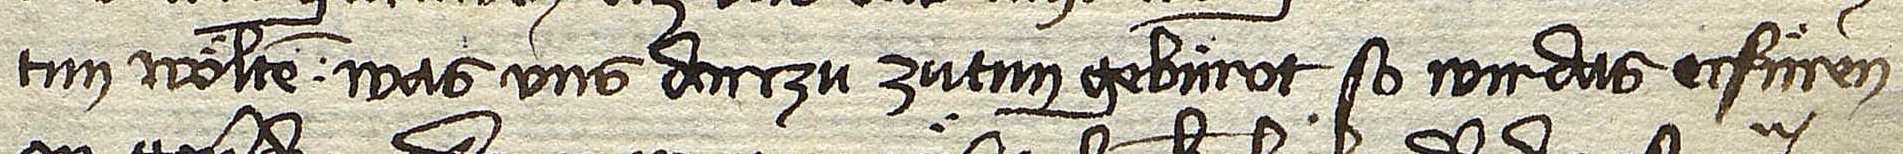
tun wölte* : was vns darcʒu ʒutun gebüret ſo wir das erfüren
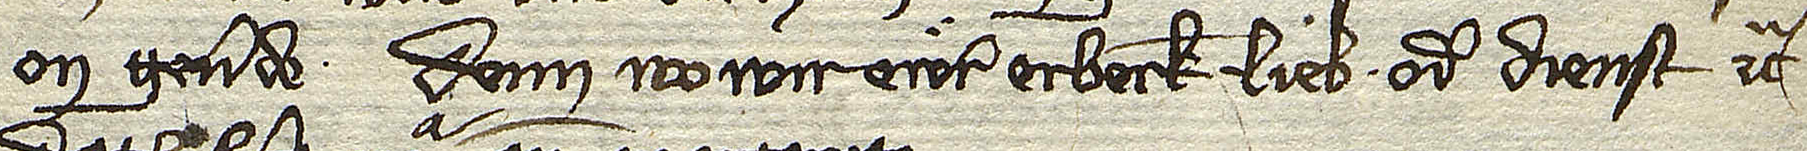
on geu*de . Denn wo wir ewr* erberk* lieb . od* dienſt ec*
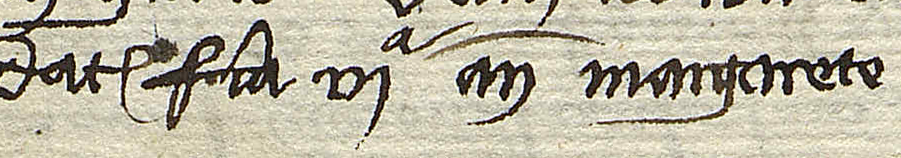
Dat* fia* vi* an* margarete
